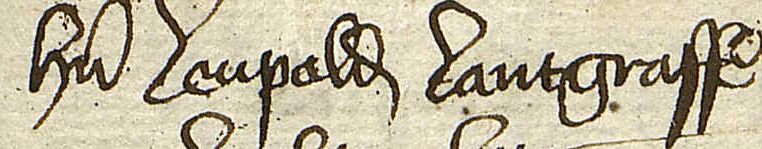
Hn* Leupold* Lantgraffe*
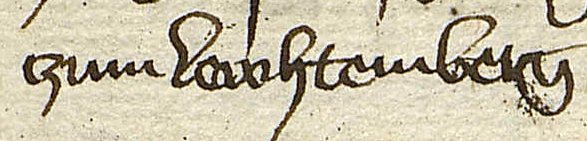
cʒum Lewhtemberg
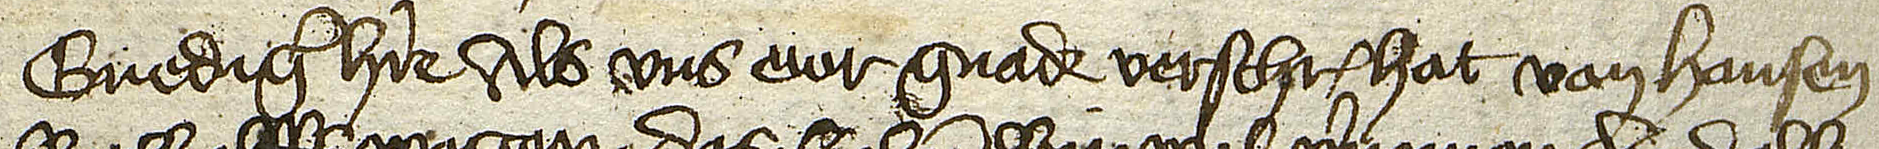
Gnedig* h*re Als vns ewr gnade verſchr* hat von Hanſen
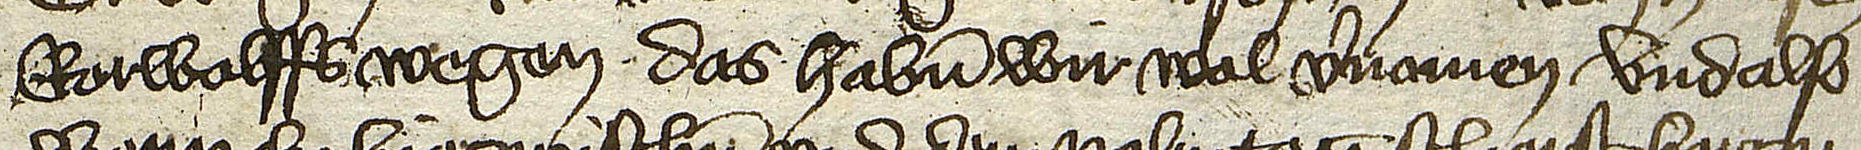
Rorwolffs wegen . das hab*n wir wol v*nomen / Vnd alſo
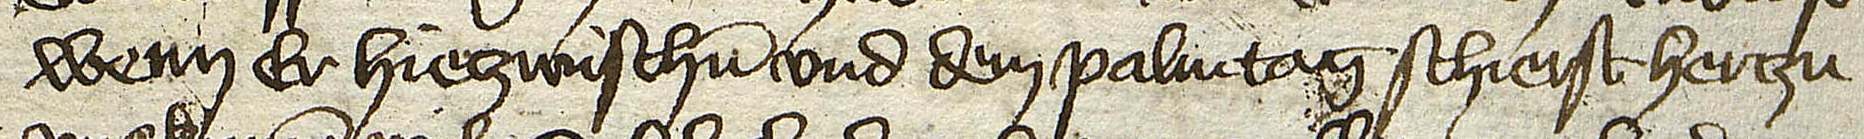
wenn Er hiecʒwiſch*n vnd dem palmtag ſchierſt hercʒu
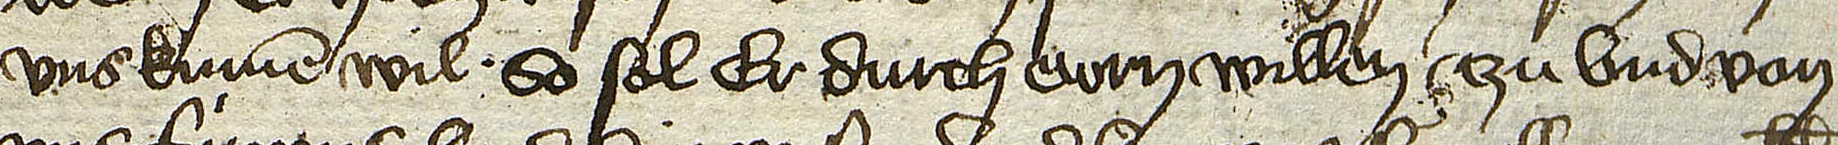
vns kume* wil . So ſol Er durch ewrn willen / cʒu vnd von
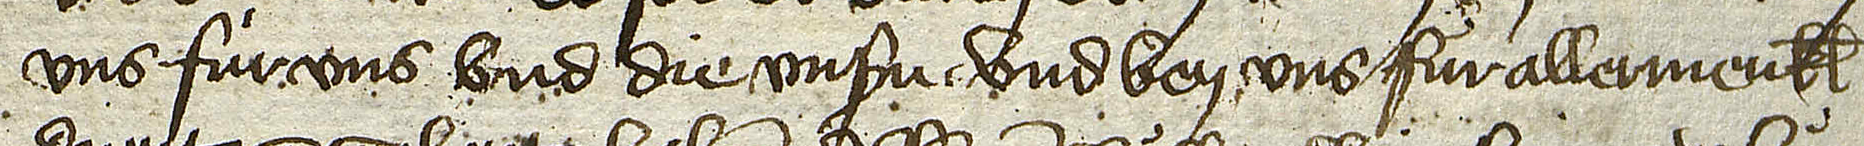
vns für vns vnd die vnſ*n . Vnd bey vns für allermenkl*
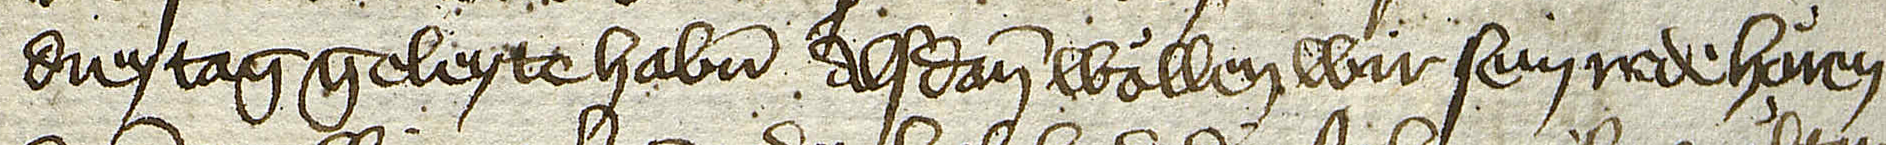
drey tag geleyte hab*n Alſdan* wöllen wir ſein rede hören
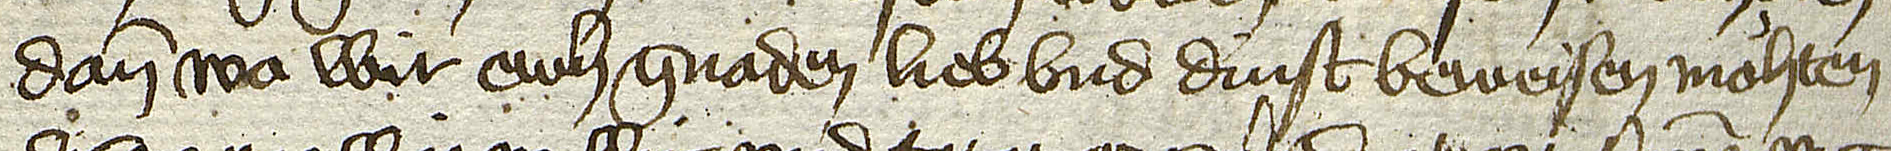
dan* wo wir ewn* gnad* lieb vnd dinſt beweiſen möhten
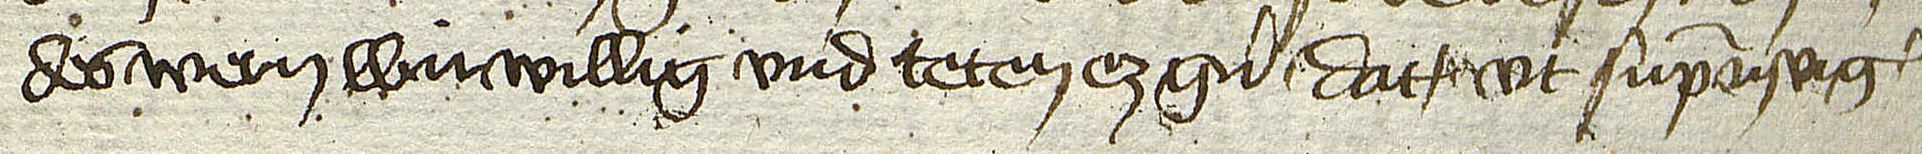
das wern wir willig vnd teten eʒ g*n / Dat* vt ſup* in vig*
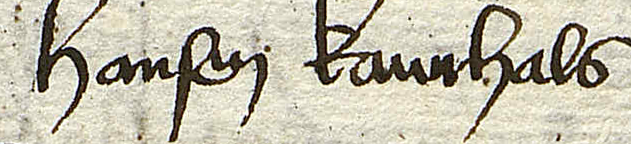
Hanſen Kawrhals
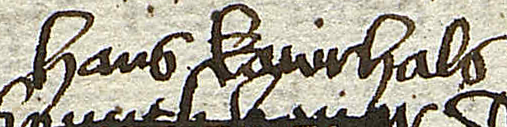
hans kawrhals
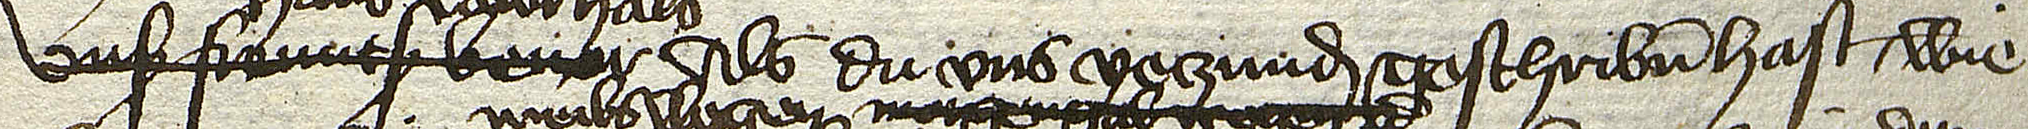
Vnſ* freuntſ* beuor Als du vns yecʒund* geſchrib*n haſt / wie
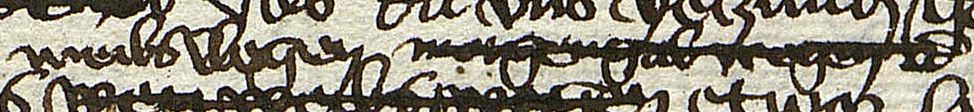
weibs wegen morgengab wegen ec*
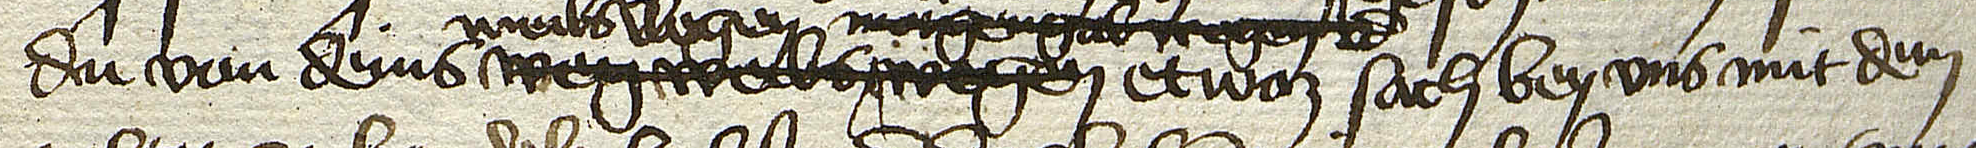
du von deins weg weibs wegen etwaʒ ſach bey vns mit den
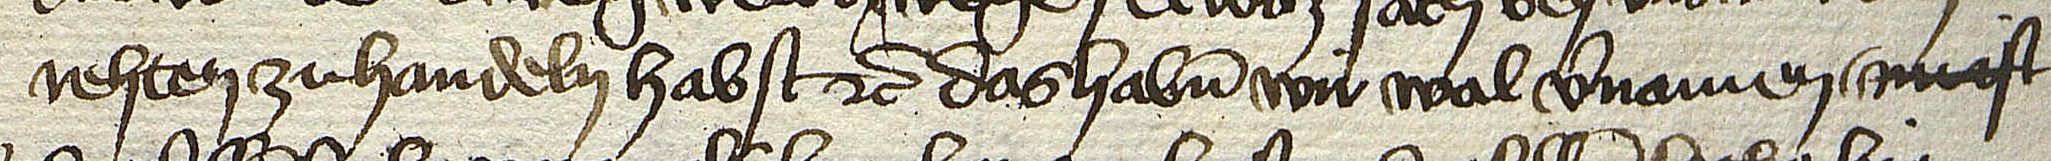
rehten ʒu handeln habſt ec* das hab*n wir wol v*nomen / nu iſt
